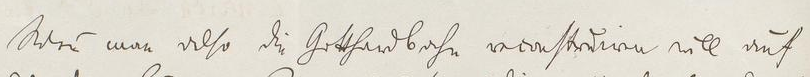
Wenn man also die Gotthardbahn reconstruiren will auf
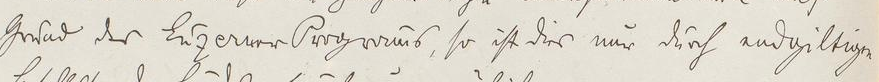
Grund des Luzerner Programms, so ist dies nur durch endgiltigen
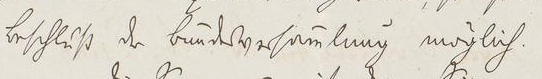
Beschluß der Bundesversammlung möglich.
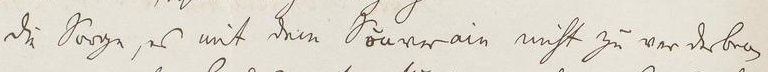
Die Sorge, es mit dem Souverain nicht zu verderben,
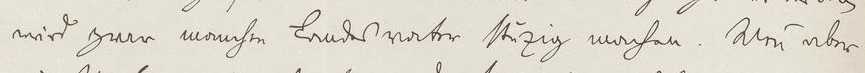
wird zwar manchen Landesvater stuzig machen. Wenn aber
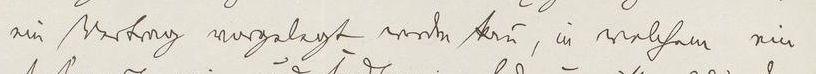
ein Vertrag vorgelegt werden kann, in welchem ein
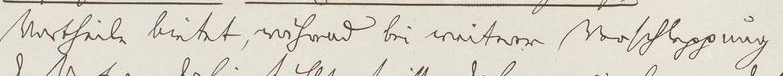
Vortheile bietet, während bei weiterer Verschleppung
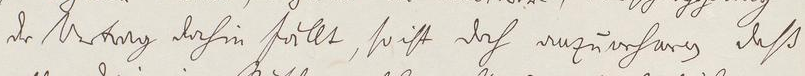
der Vertrag dahin fällt, so ist doch anzunehmen, daß
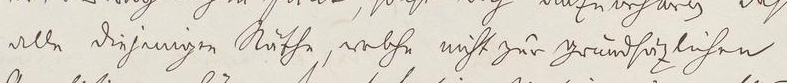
alle diejenigen Räthe, welche nicht zur grundsätzlichen
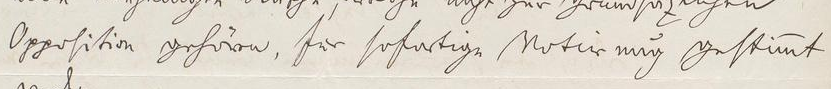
Opposition gehören, für sofortige Votirung gestimmt
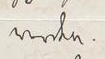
werden.
